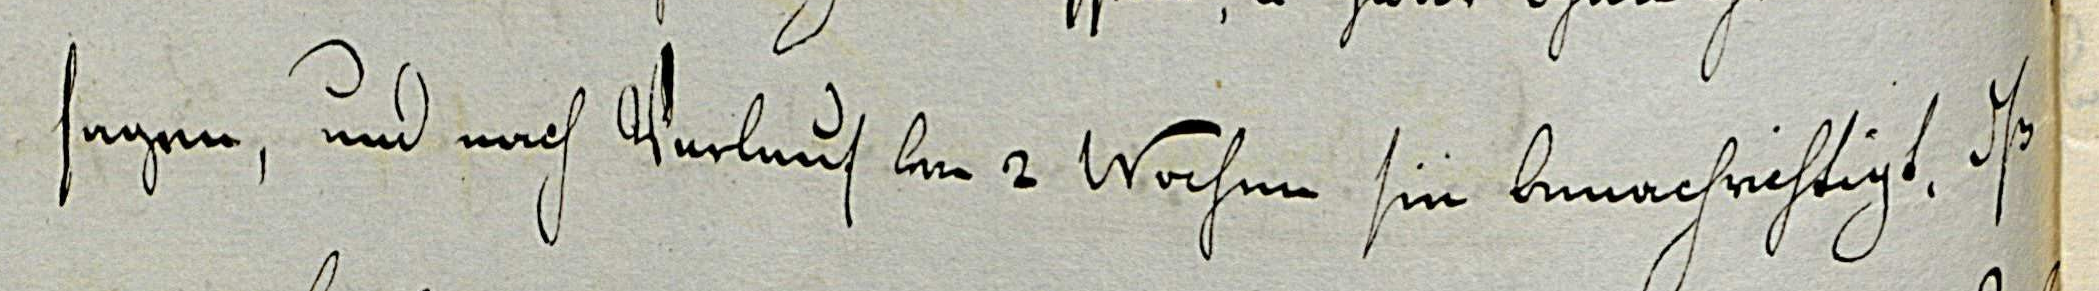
sagen, und nach Verlauf von 2 Wochen sie benachrichtigt, daß
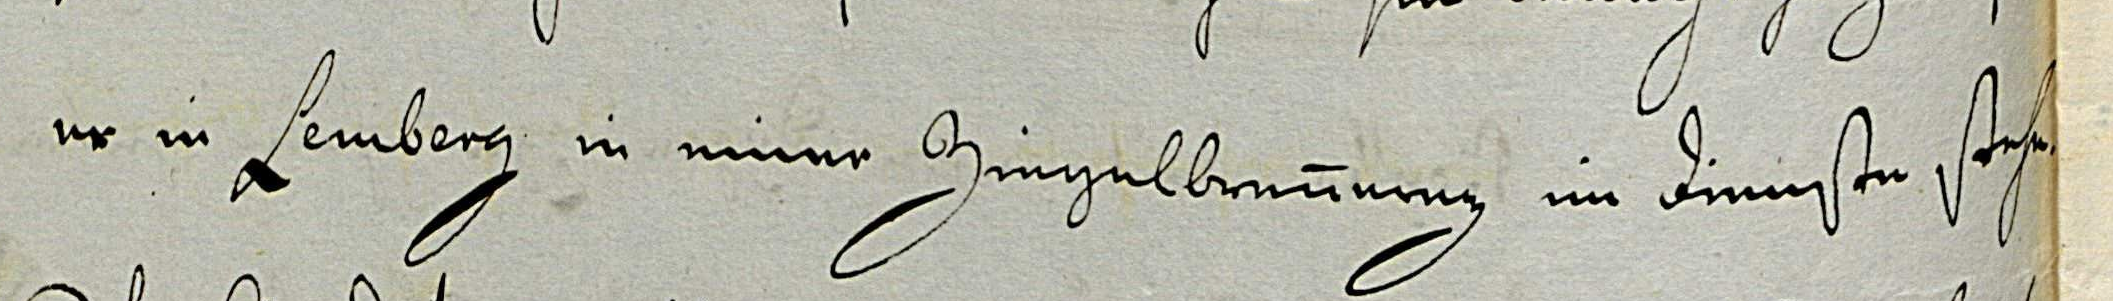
er in Lemberg in einer Ziegelbrennung in Dienste stehe.
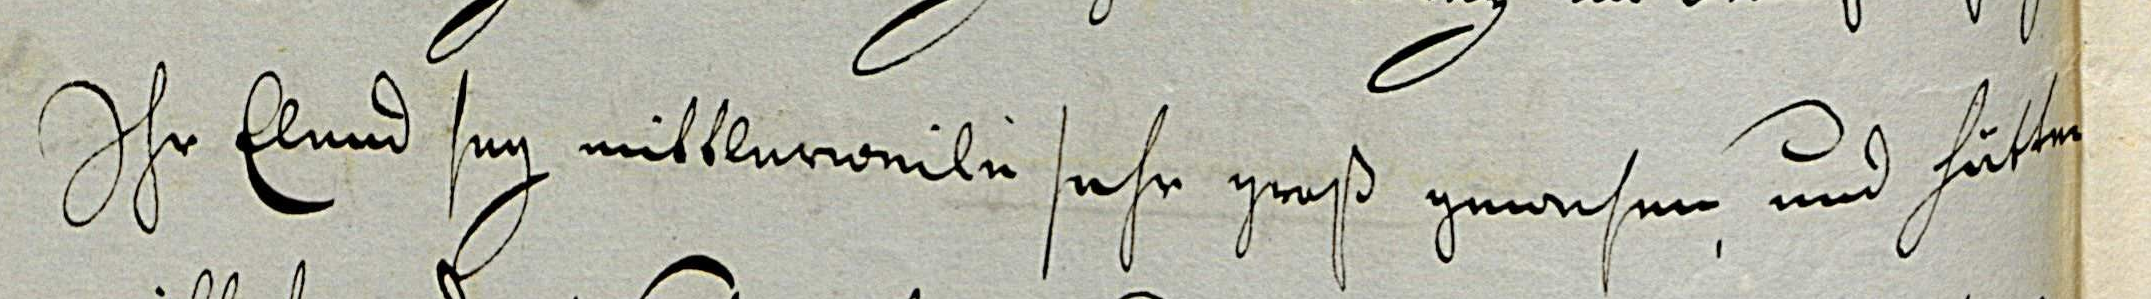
Ihr Elend sey mittlerweile sehr groß gewesen und hätten
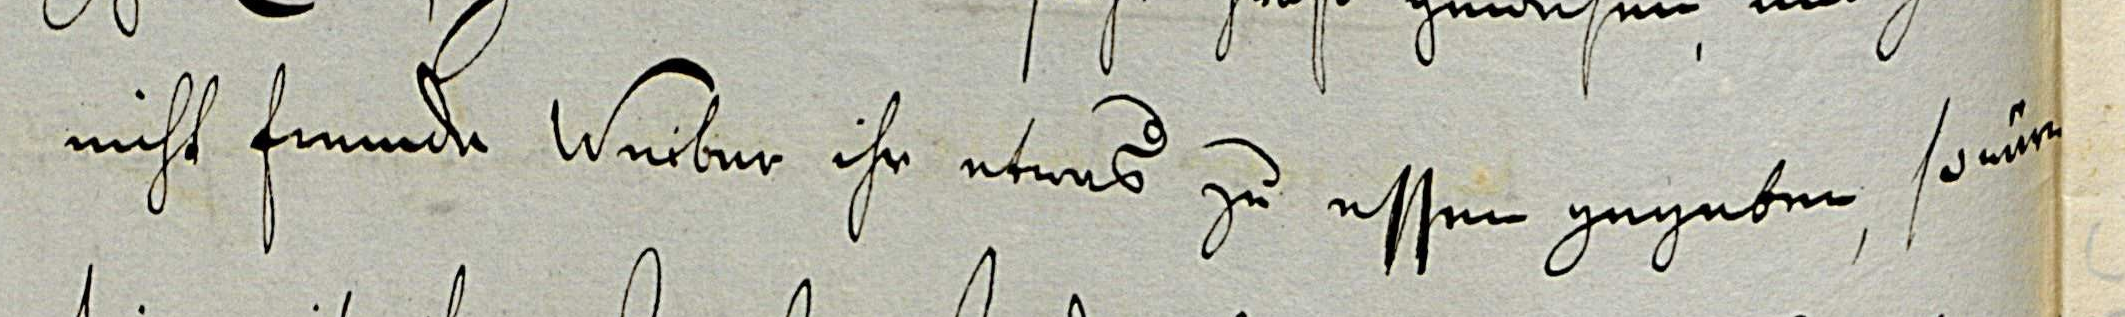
nicht fremde Weiber ihr etwas zu essen gegeben, so ware
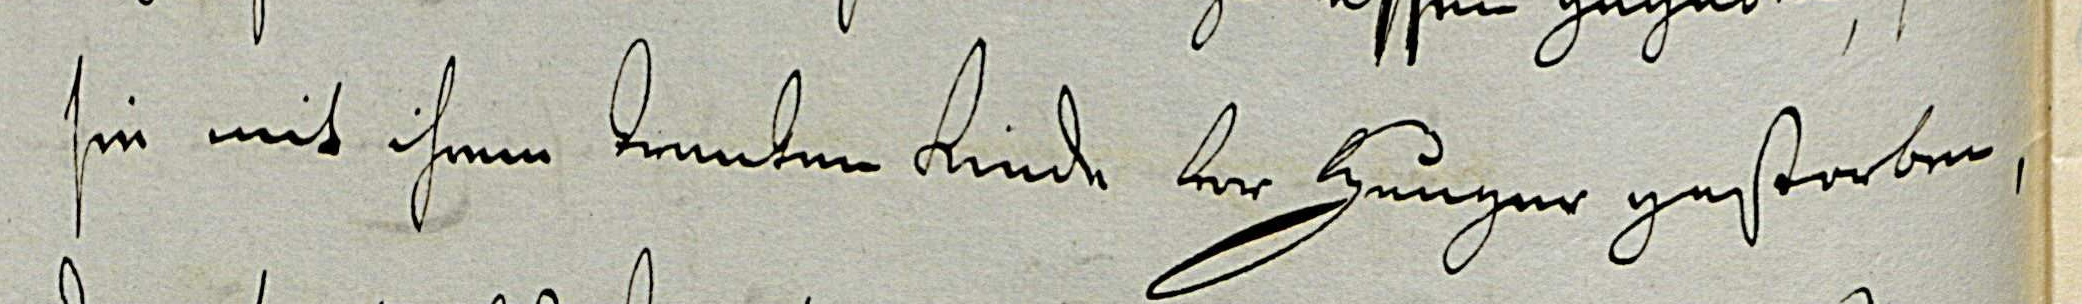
sie mit ihren kranken Kinde vor Hunger gestorben,
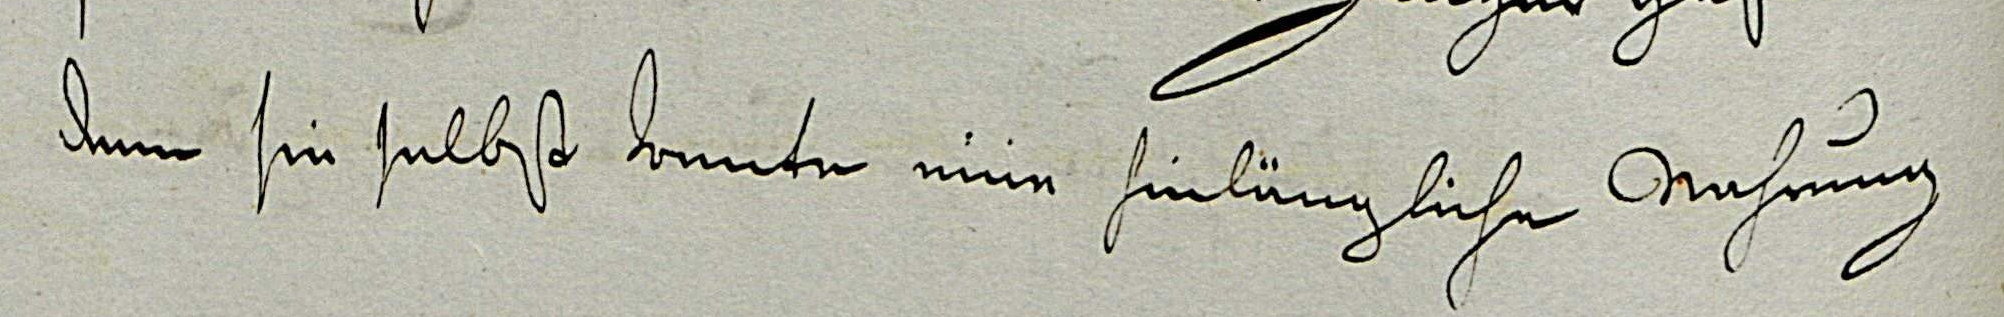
denn sie selbst konnte eine hinlängliche Nahrung
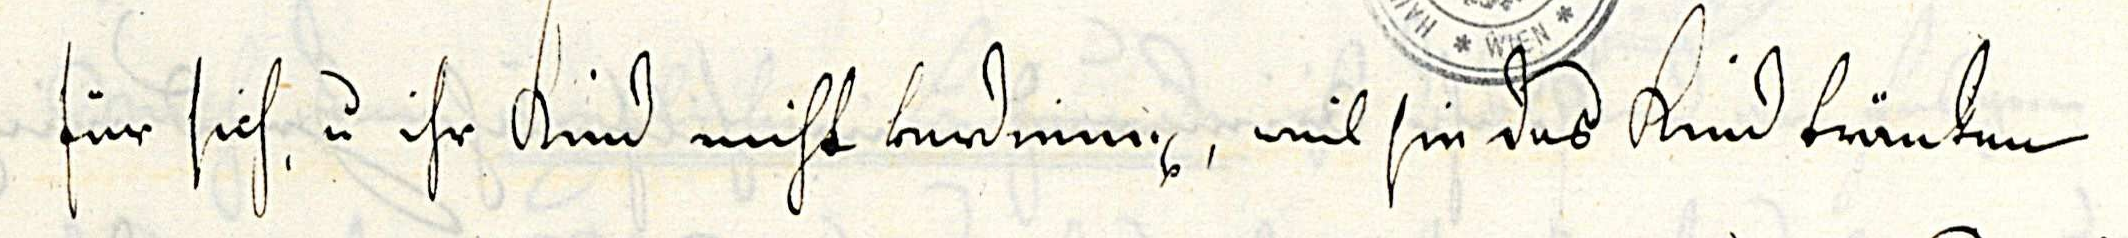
für sich u. ihr Kind nicht verdienen, weil sie das Kind tränken
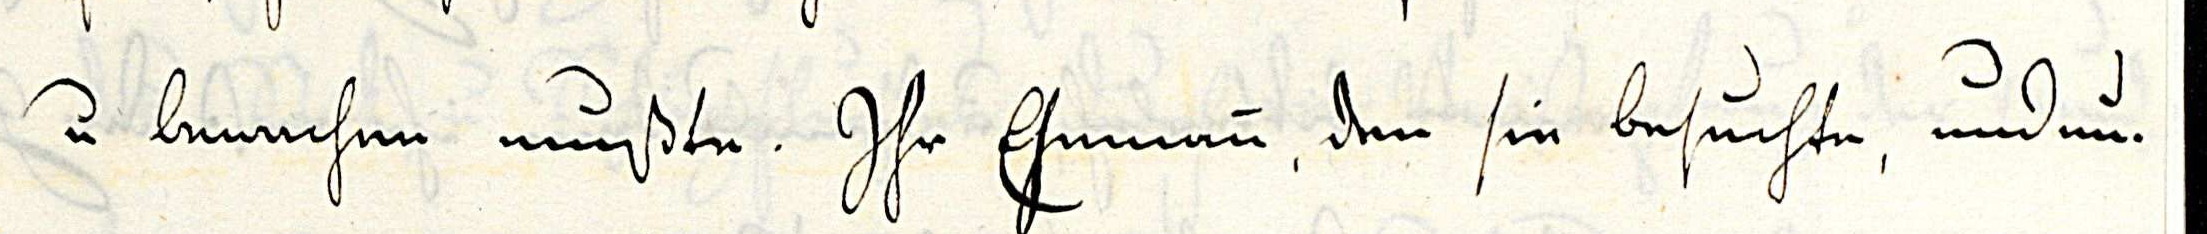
u. bewachen mußte. Ihr Ehemann, den sie besuchte, und um
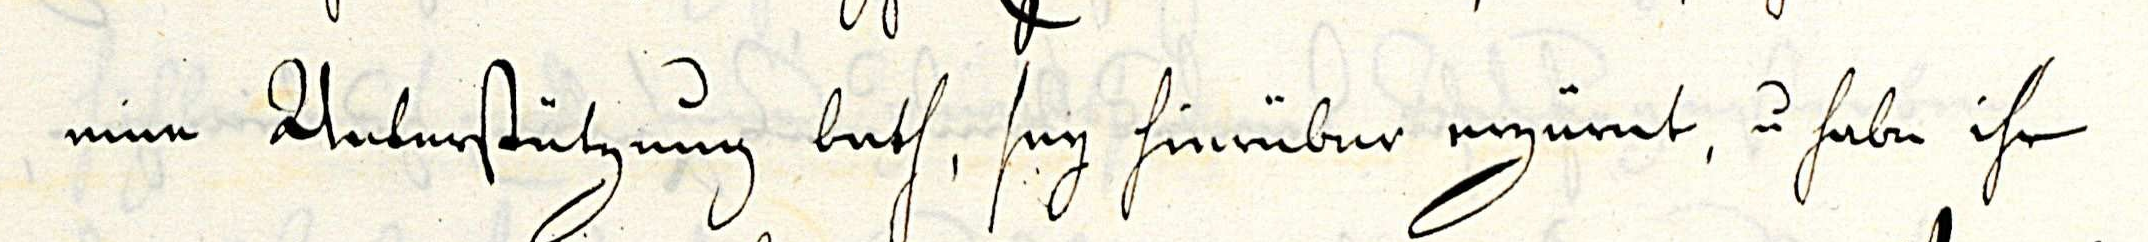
eine Uberstützung bath, sey hierüber erzürnt, u. habe ihr
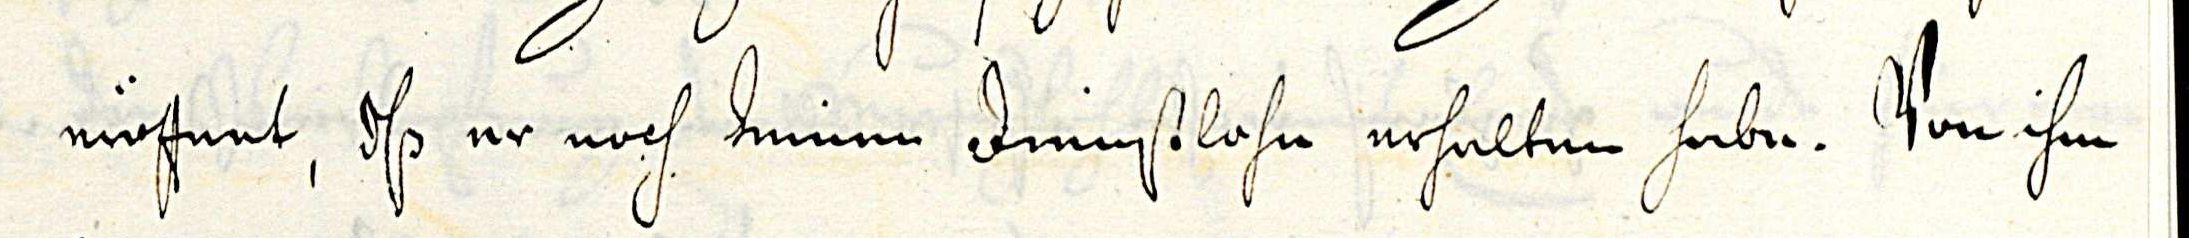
aüssert, daß er noch kein Dienstlohn erhalten habe. Von ihm
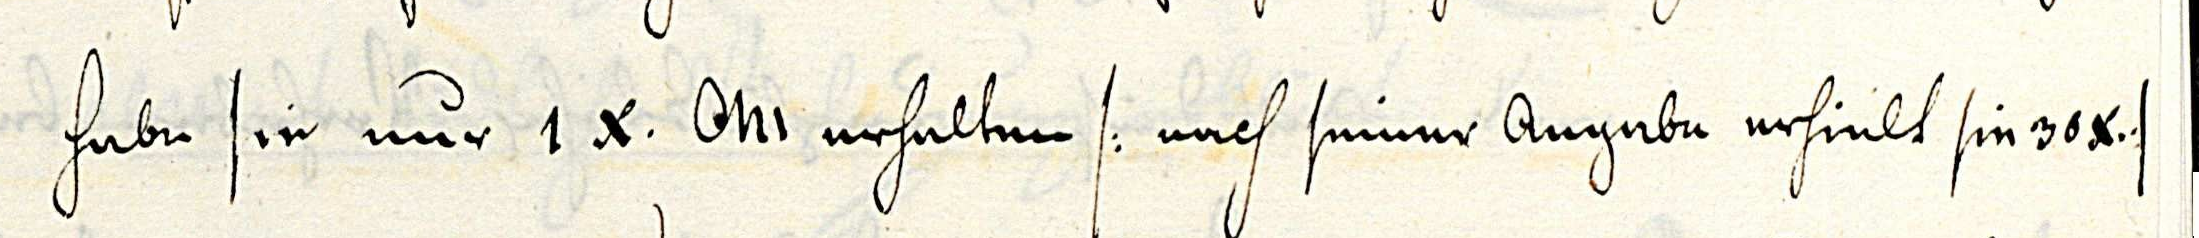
habe sie nur 1 x OW erhalten (nach seiner Angabe erhielt sie 36 x)
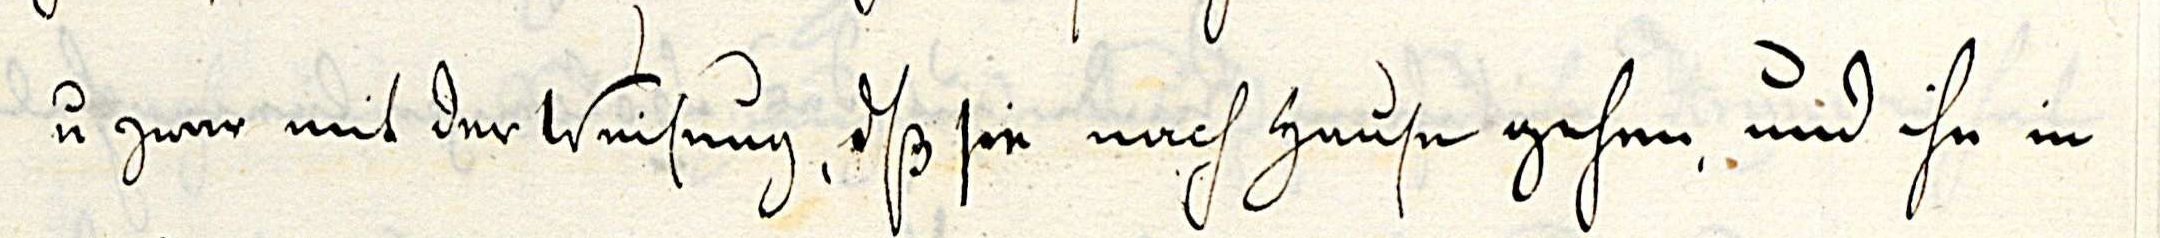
u zwar mit der Weisung, daß sie nach Hause gehen, und ihn in
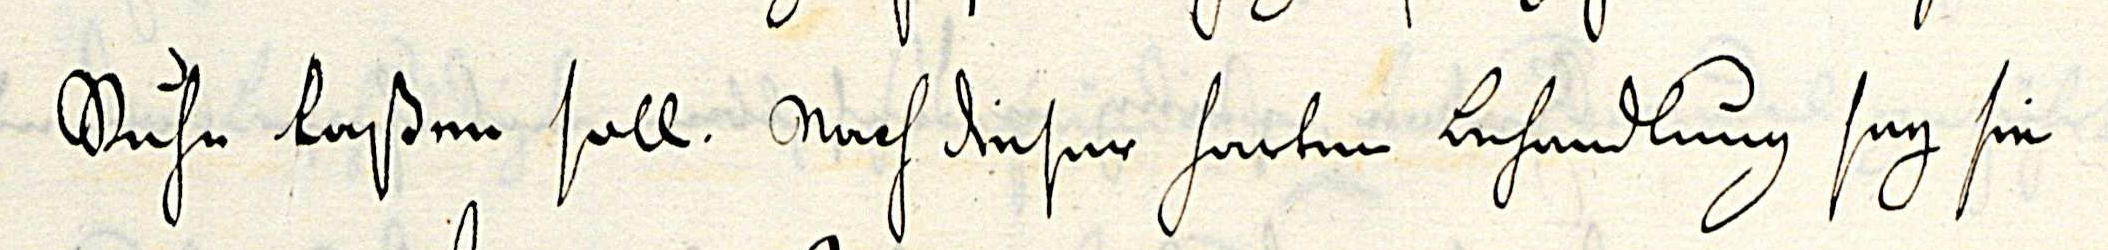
Ruhe laßen soll. Nach dieser harten Behandlung sey sie
